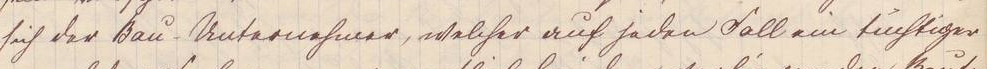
sich der Bau-Unternehmer, welcher auf jeden Fall ein tüchtiger
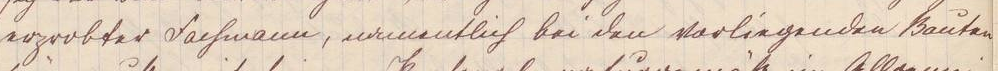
erprobter Fachmann, namentlich bei den vorliegenden Bauten
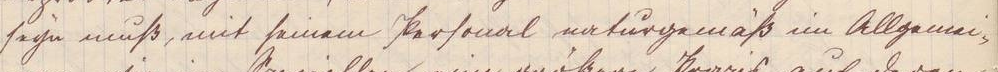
seyn muß, mit seinem Personal naturgemäß im Allgemei-
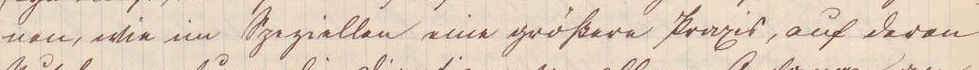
nen, wie im Speziellen eine größere Praxis, auf deren
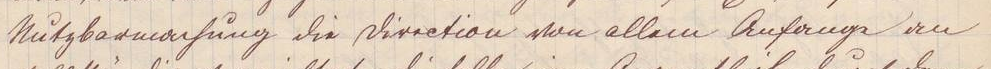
Nutzbarmachung die Direction von allem Anfange an
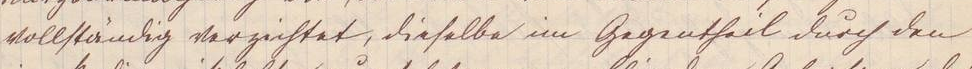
vollständig verzichtet, dieselbe im Gegentheil durch den
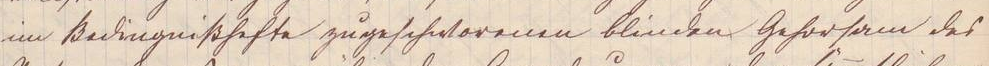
im Bedingnißhefte zugeschworenen blinden Gehorsam des
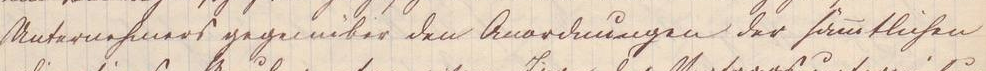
Unternehmers gegenüber den Anordnungen der sämmtlichen
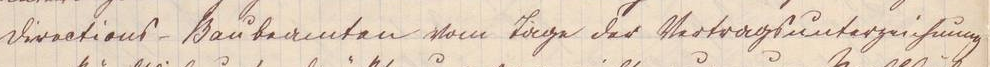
Directions-Baubeamten vom Tage der Vertragsunterzeichnung
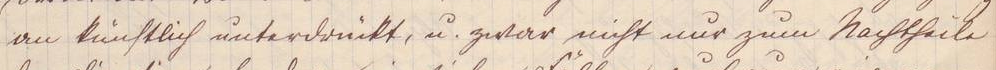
an künstlich unterdrückt, u. zwar nicht nur zum Nachtheile
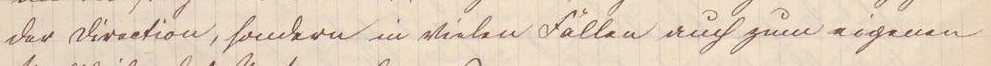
der Direction, sondern in vielen Fällen auch zum eigenen
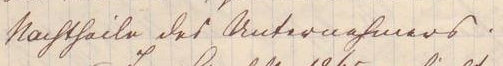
Nachtheile des Unternehmers. –
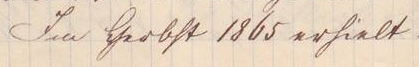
Im Herbst 1865 erhielt
